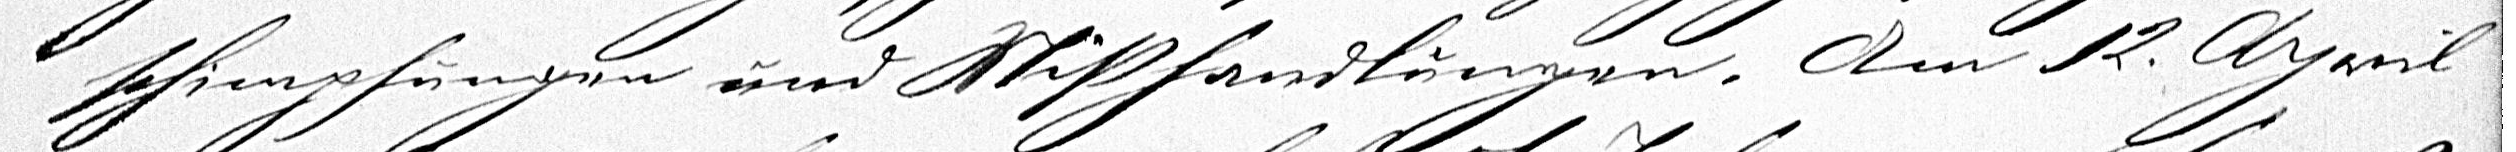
schimpfungen und Mißhandlungen. Am 12. April
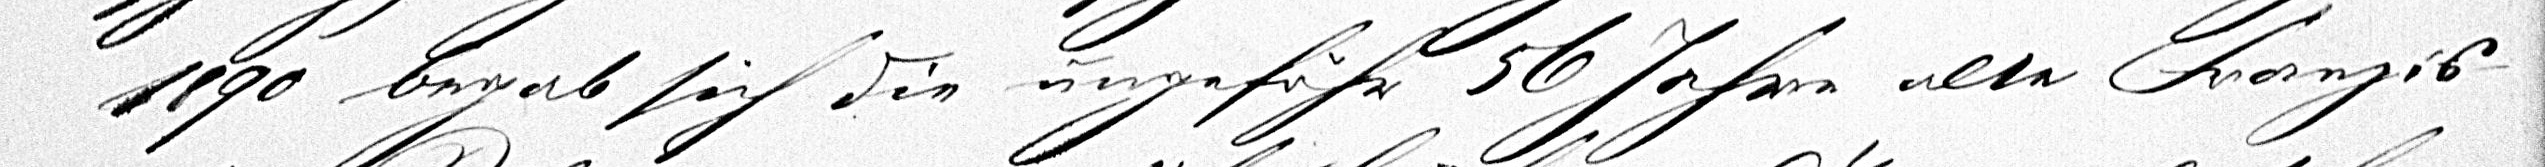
1890 begab sich die ungefähr 56 Jahre alte Franzis¬
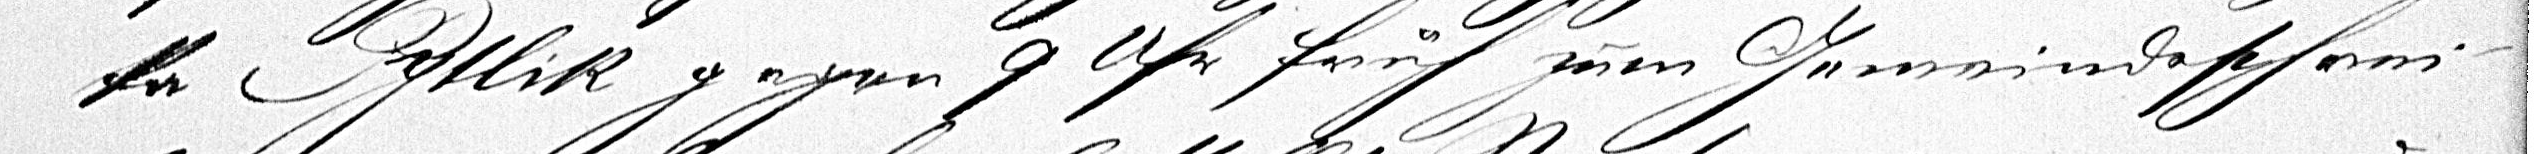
ka Pytlik gegen 9 Uhr früh zum Gemeindeschrei¬
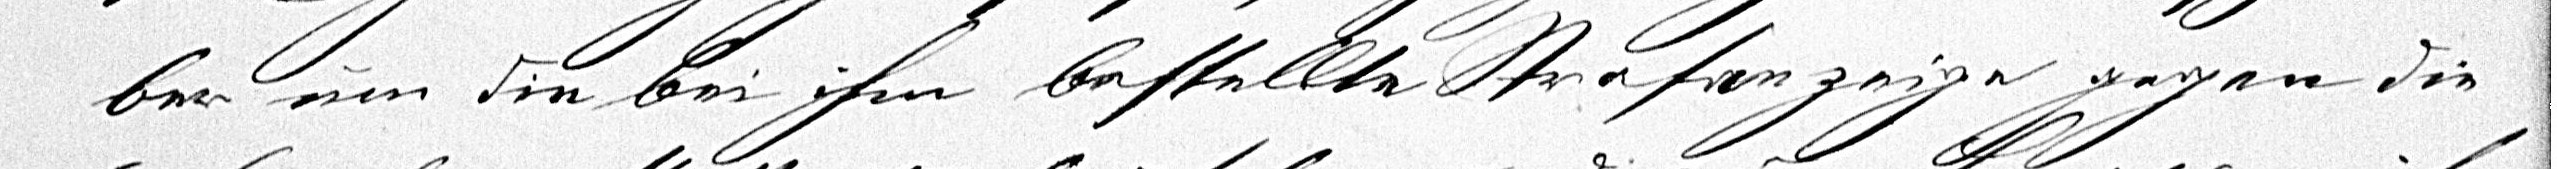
ber um die bei ihm bestellte Strafanzeige gegen die
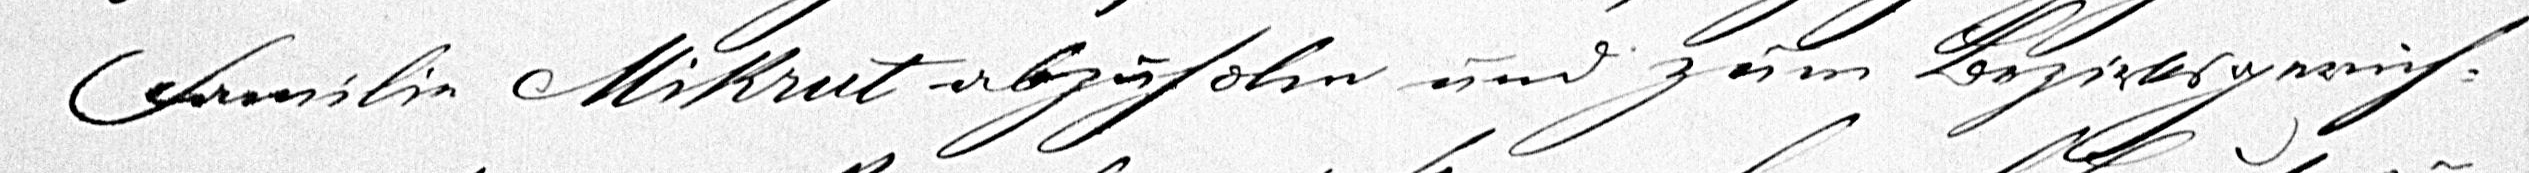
Familie Mikrut abzuholen und zum Bezirksgerich¬
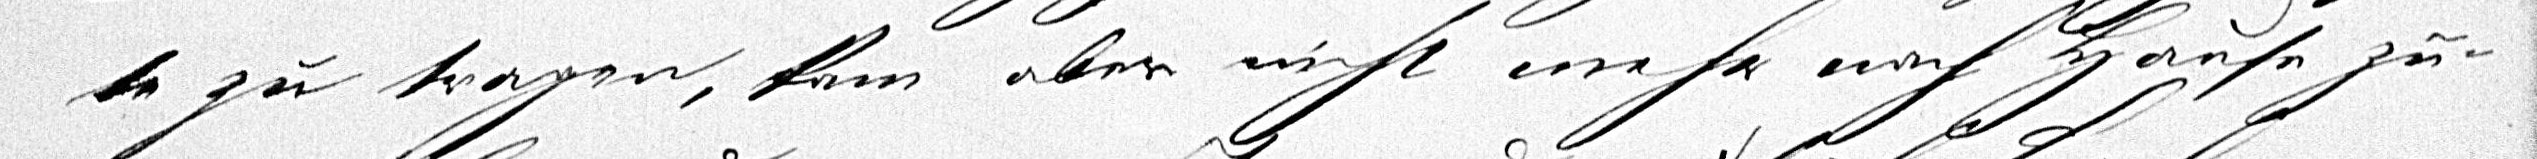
te zu tragen, kam aber nicht mehr nach Hause zu¬
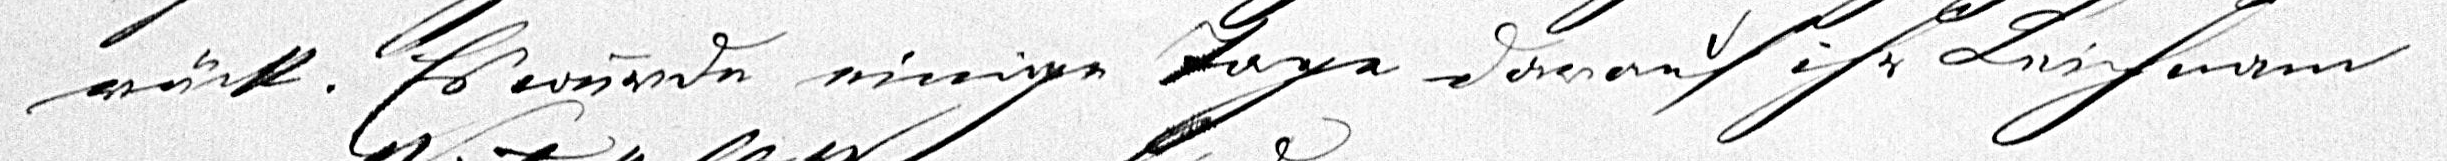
rück. Es wurde einige Tage - darauf ihr Leichnam
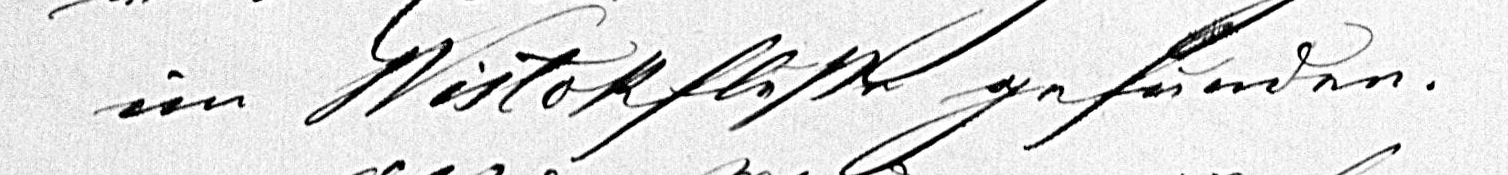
im Wistokfluße gefunden.
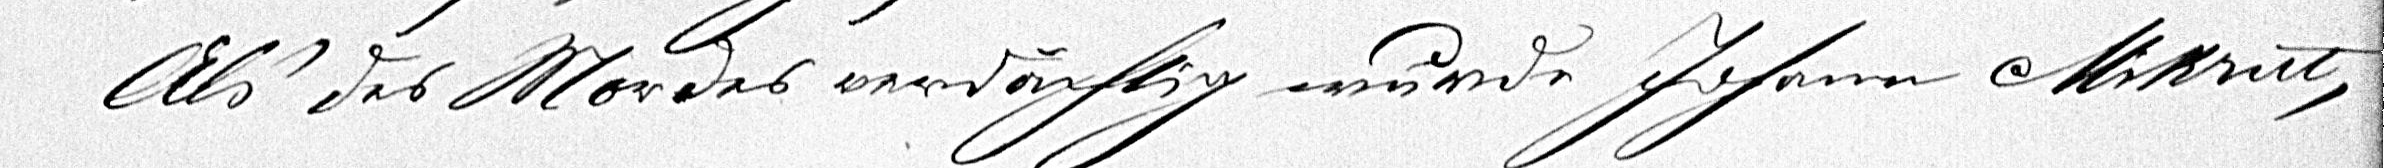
Als der Mordes verdächtig wurde Johann Mikrut,
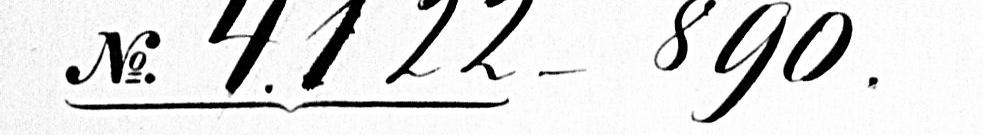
N° 4.122-890.
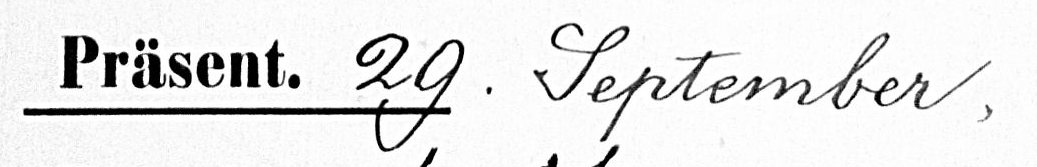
Präsent. 29. September,
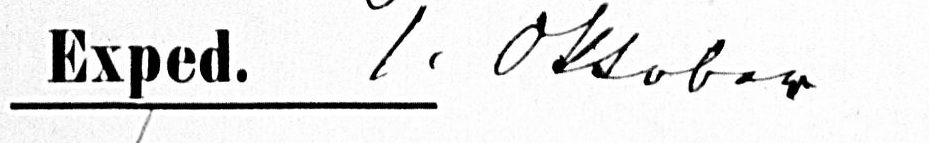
Exped. 1. Oktober
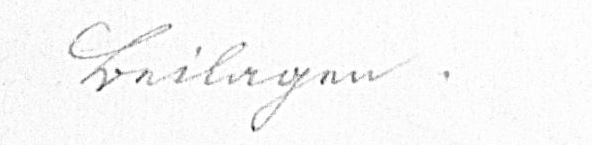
Beilagen.
